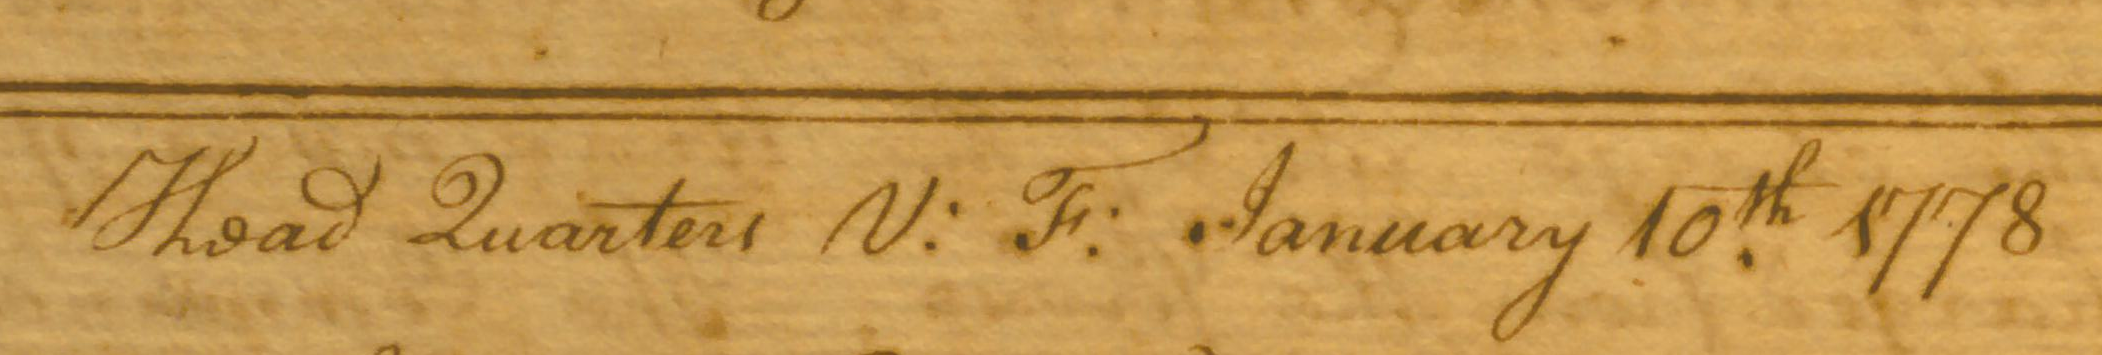Head Quarters V: F: January 10^th. 1778
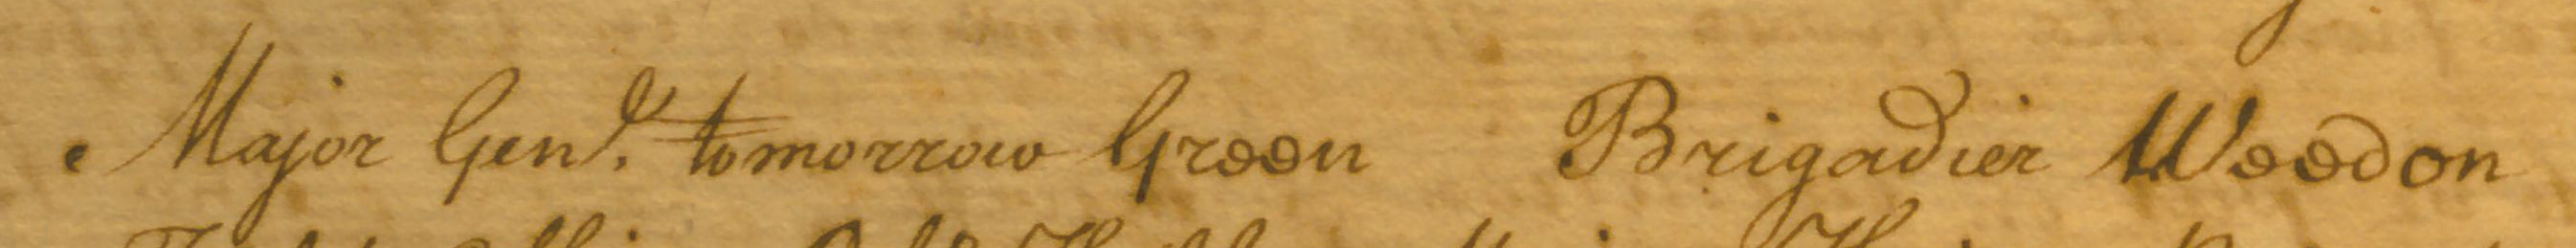Major Gen^l. tomorrow Green Brigadier Weedon
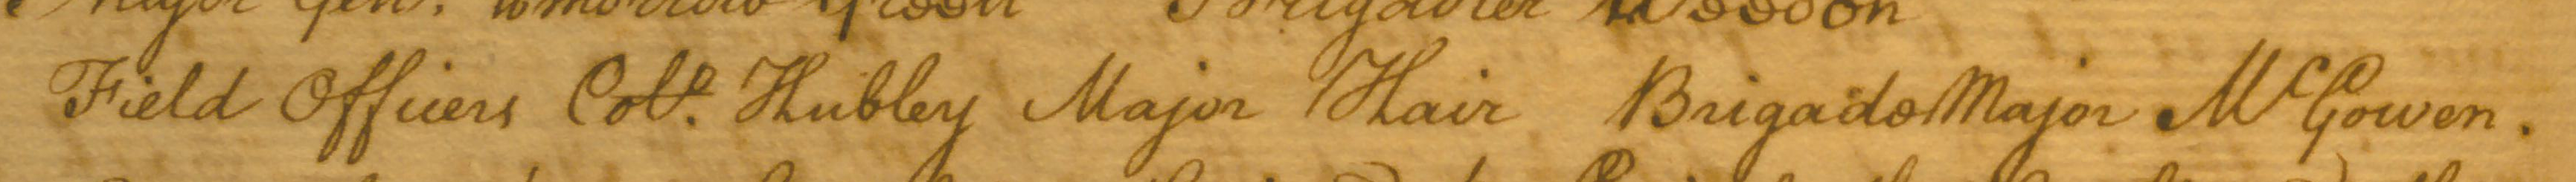Field Officers Col^o. Hubley Major Hair Brigade Major M^cGowen.
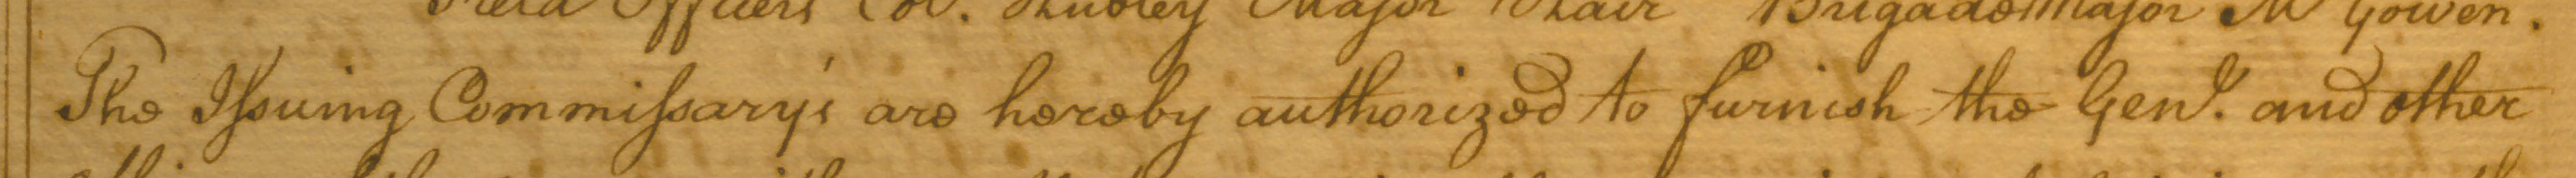The Issuing Commissary's are hereby authorized to furnish the Gen^l. and other
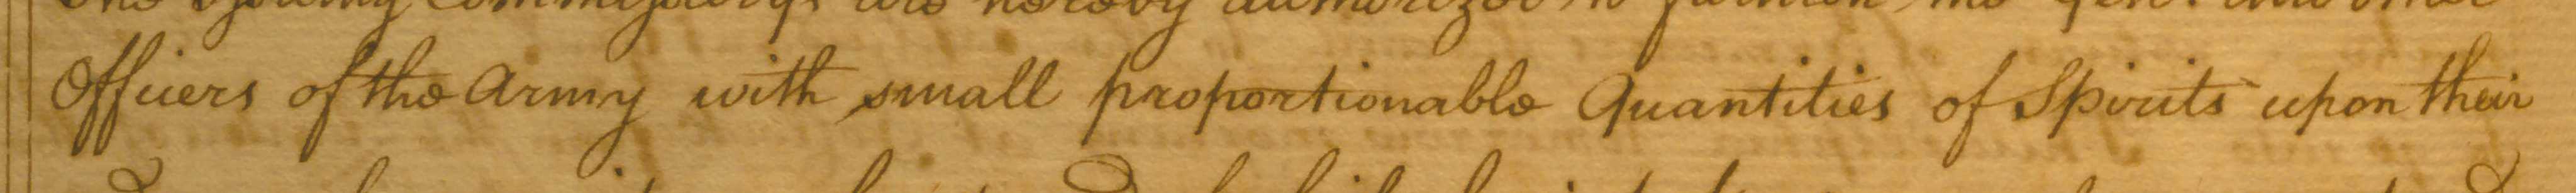Officers of the army with small proportionable Quantities of spirits upon their
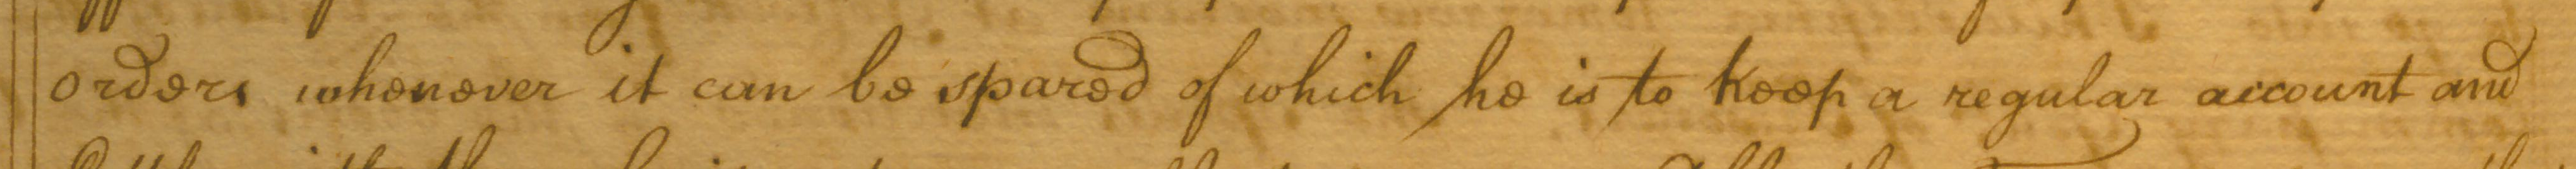orders whenever it can be spared of which he is to keep a regular account and
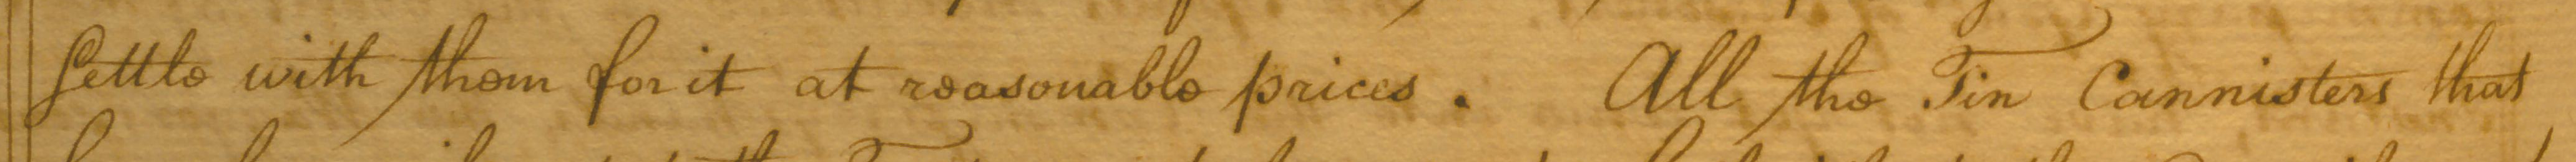settle with them for it at reasonable prices. All the Tin Cannisters that
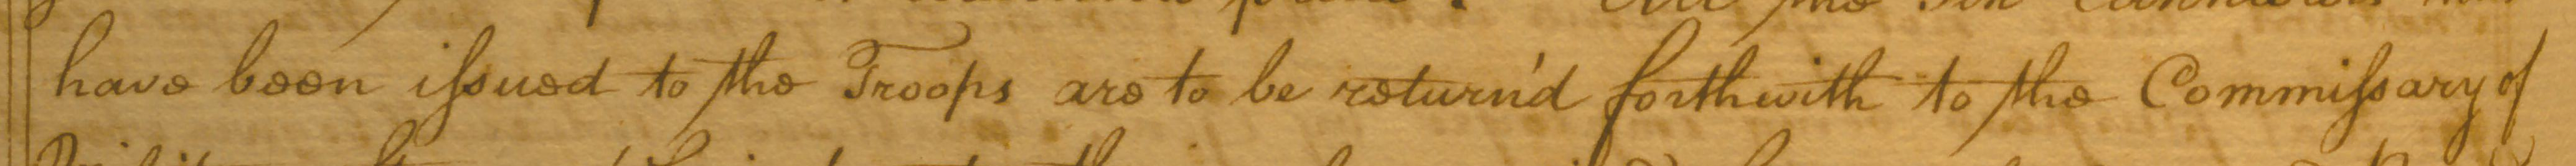have been issued to the Troops are to be return'd forthwith to the Commissary of
